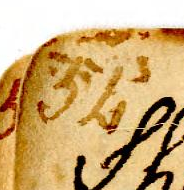54
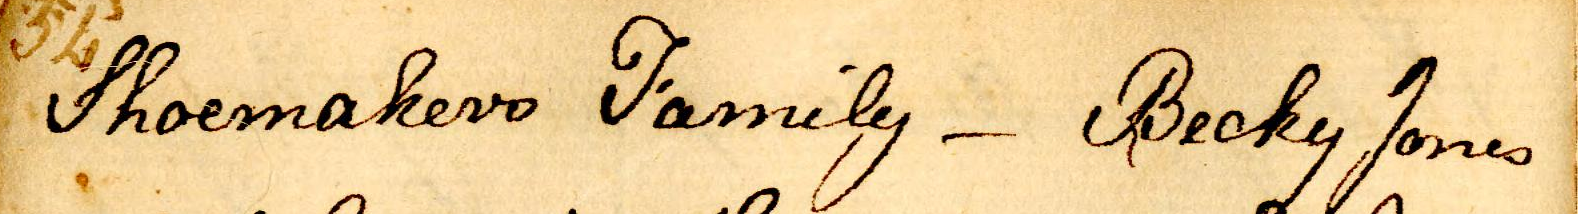Shoemakers Family- Becky Jones
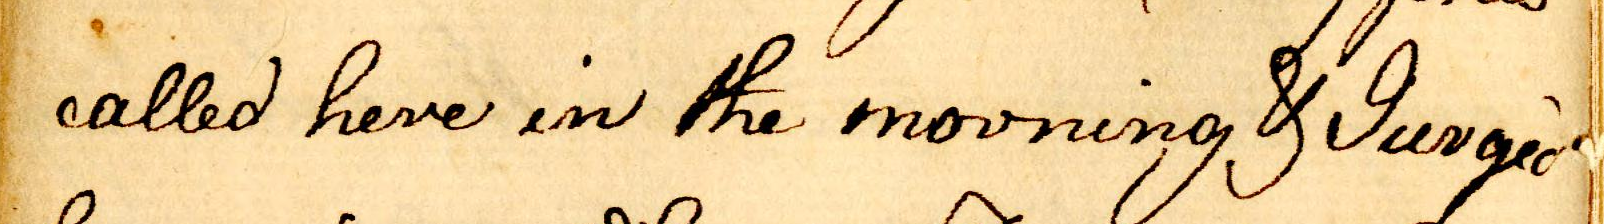called here in the morning & I urged
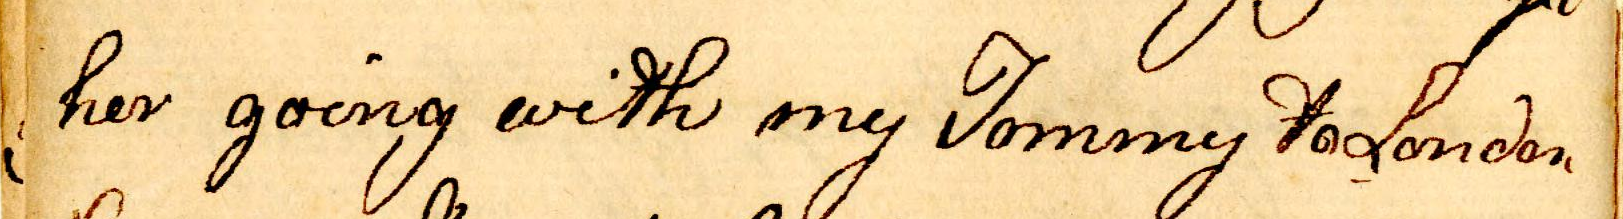her going with my Tommy to London
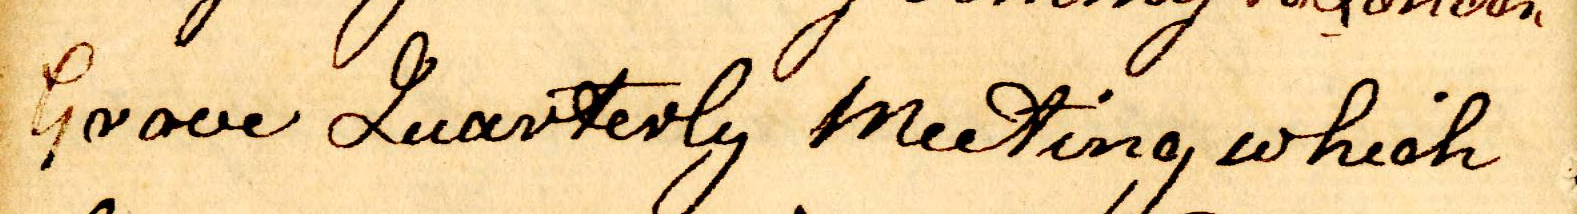Grove Quarterly Meeting, which
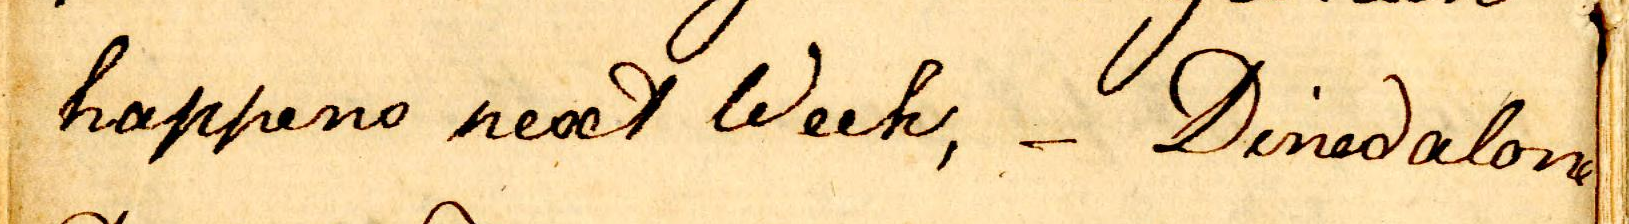happens next Week,- Dined alone
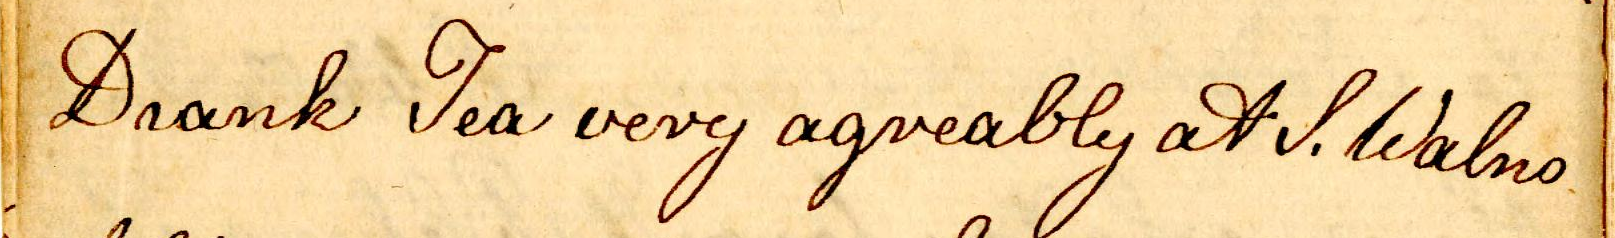Drank Tea very agreably at S. Walns
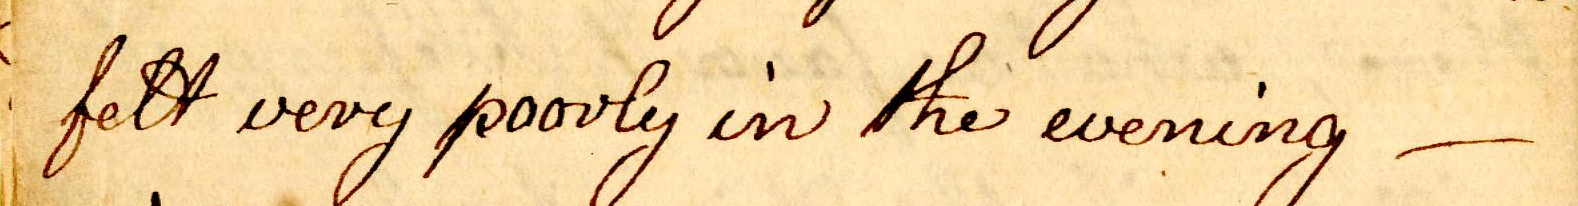felt very poorly in the evening-
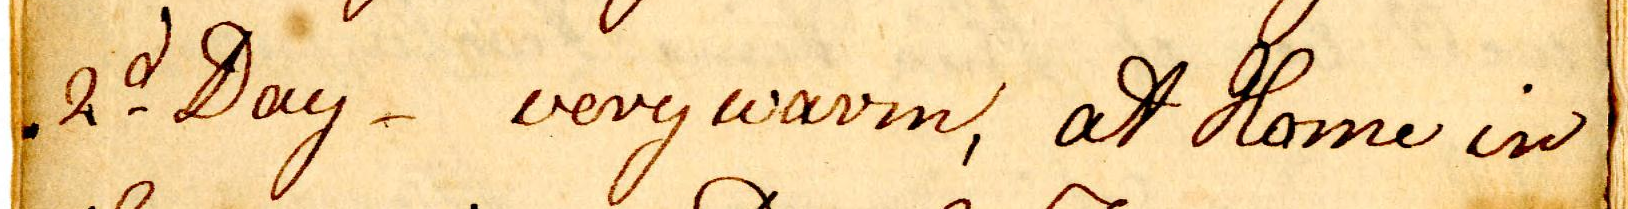2^d Day- very warm, at Home in
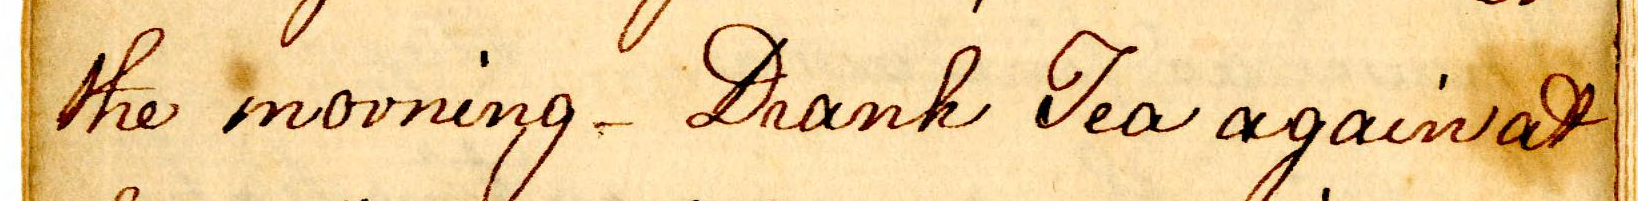the morning- Drank Tea again at
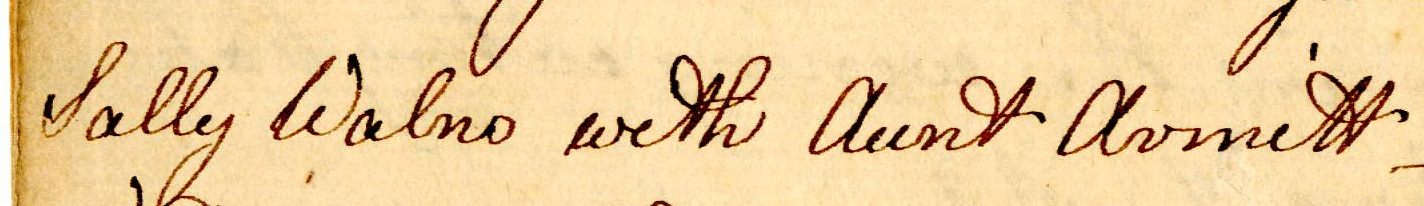Sally Walns with Aunt Armitt-
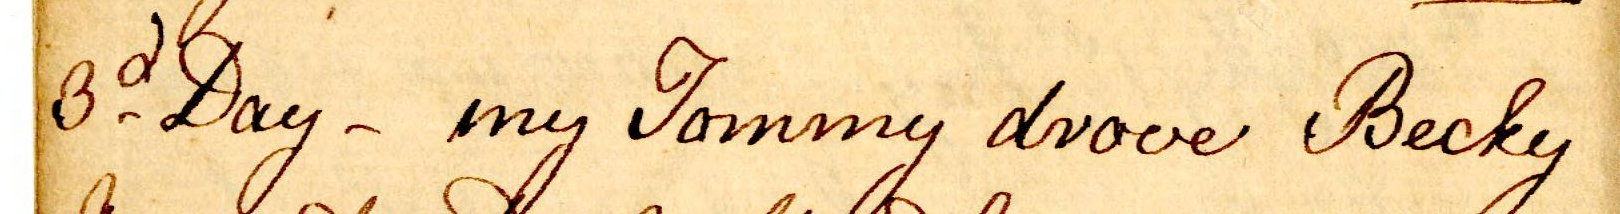3^d Day- my Tommy drove Becky
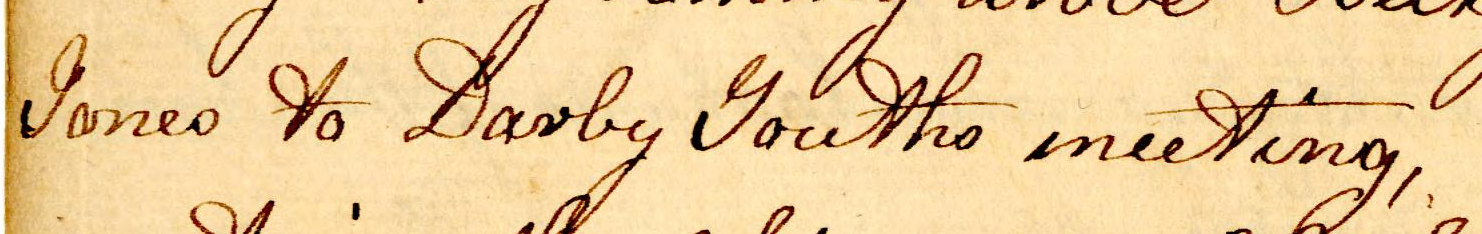Jones to Darby Youths meeting,
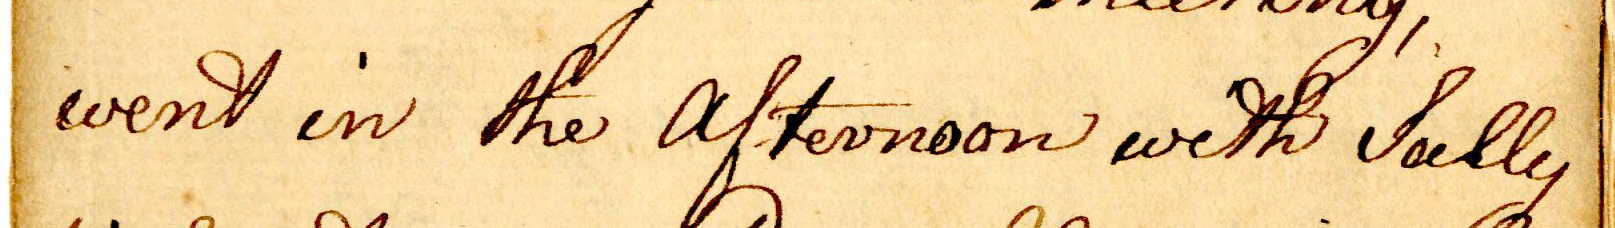went in the Afternoon with Sally
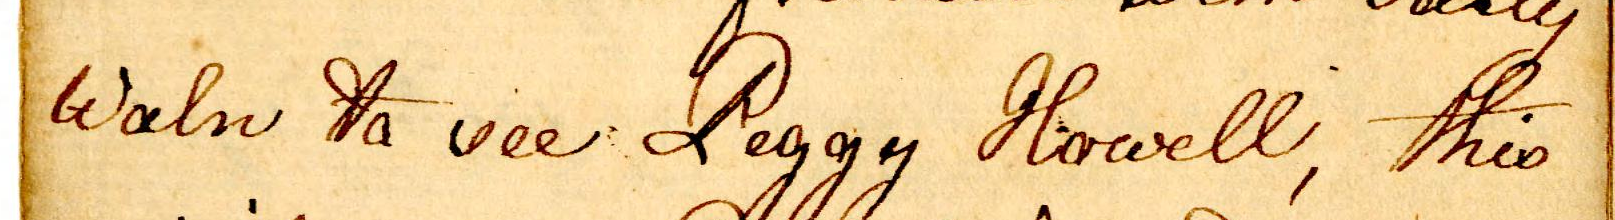Waln to see Peggy Howell, this
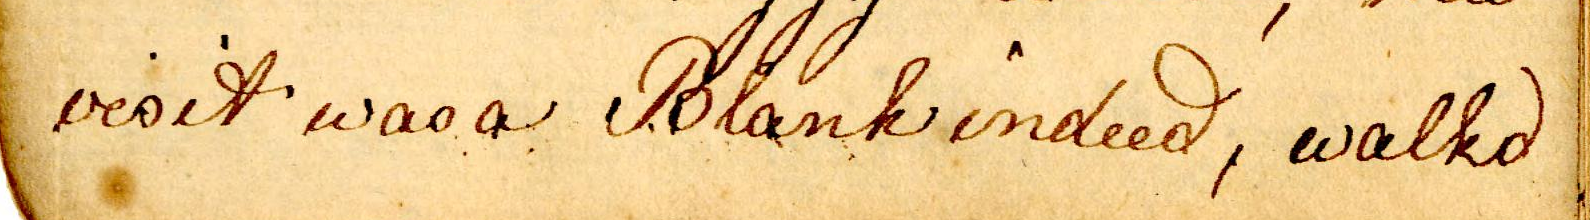visit was a Blank indeed, walkd
